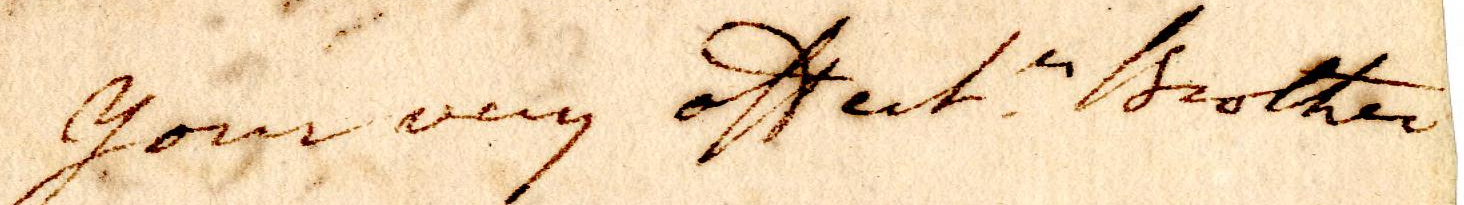Your very affect^n Brother
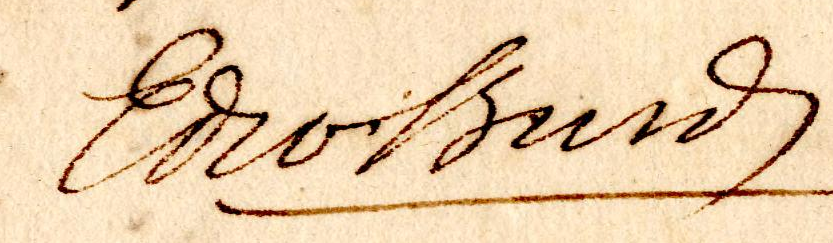Edw. Burd
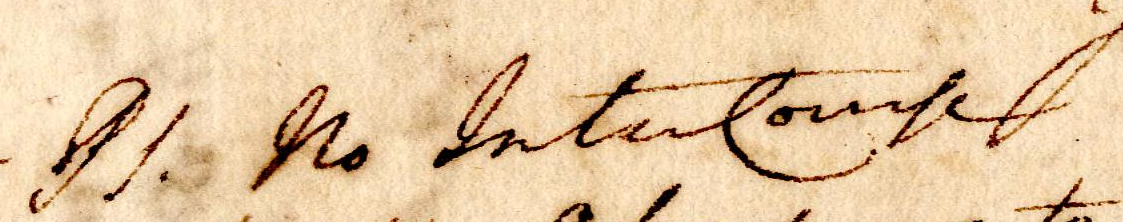PS. no Intercourse
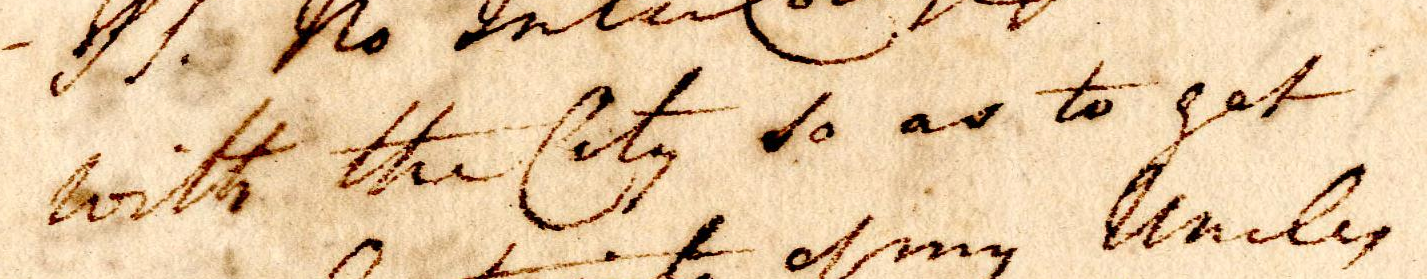with the City so as to get
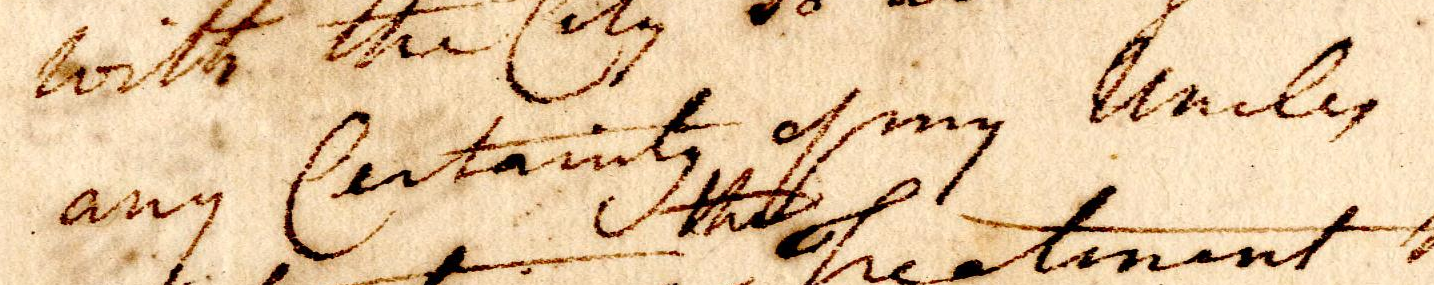any Certainty of my Uncles
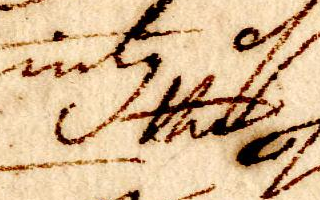the
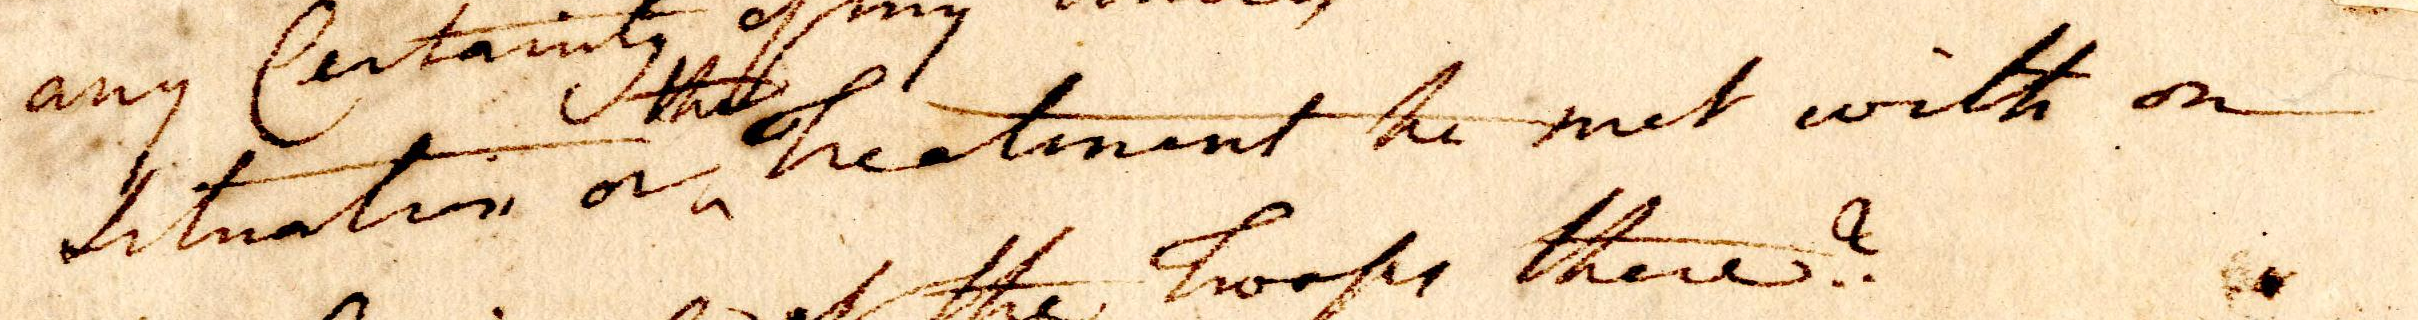Situation or treatment he met with on
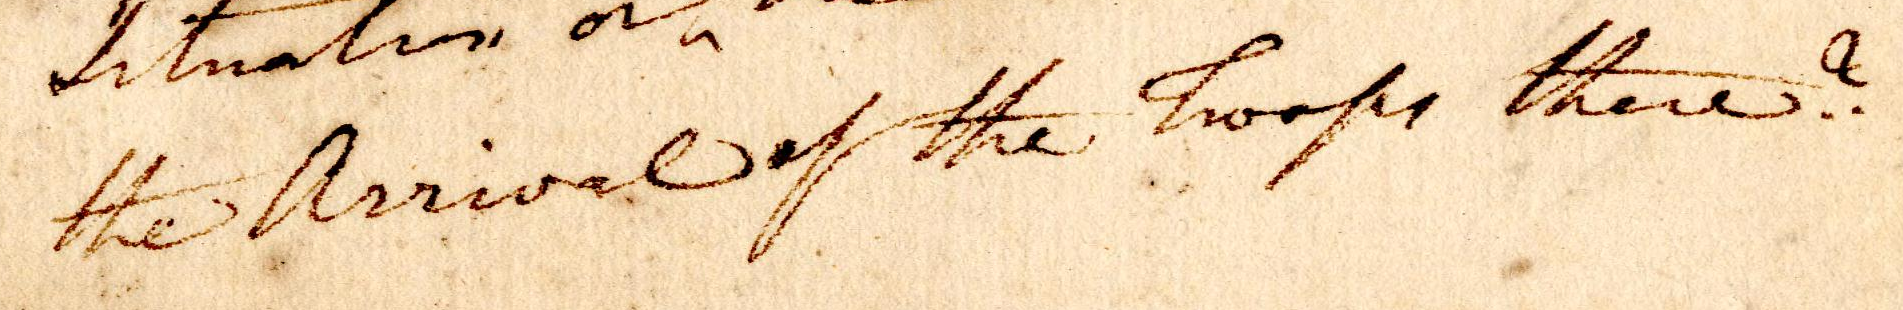the Arrival of the Troops there?
